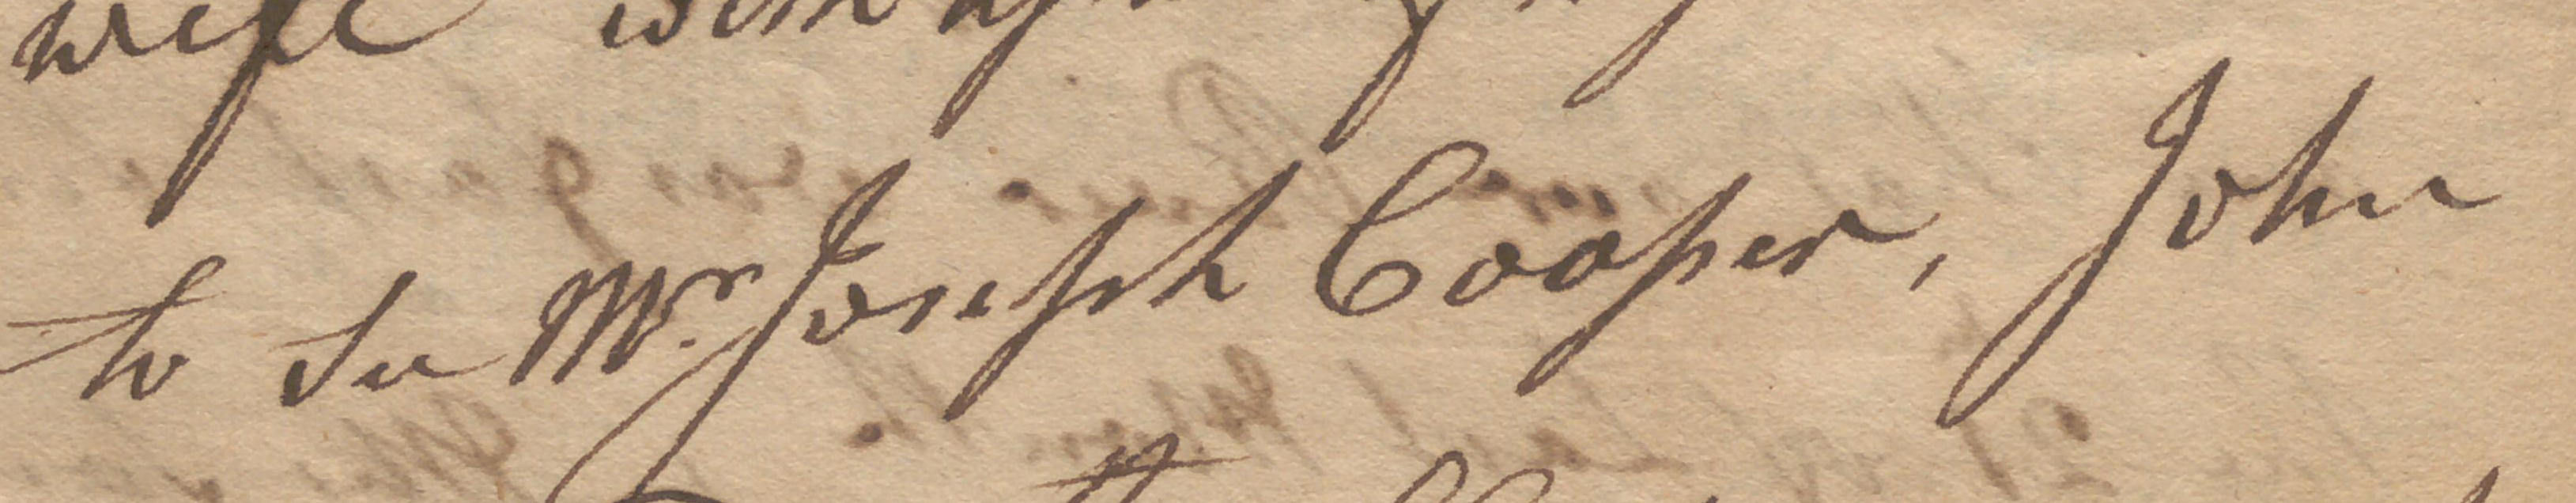to see M^r Joseph Cooper, John
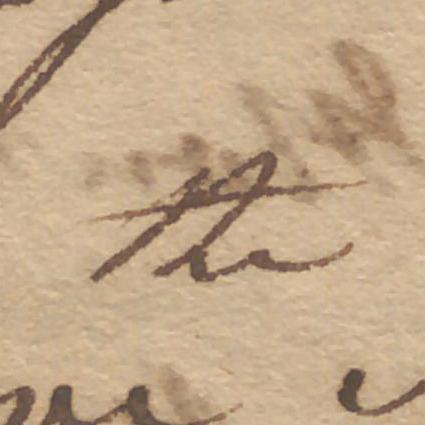the
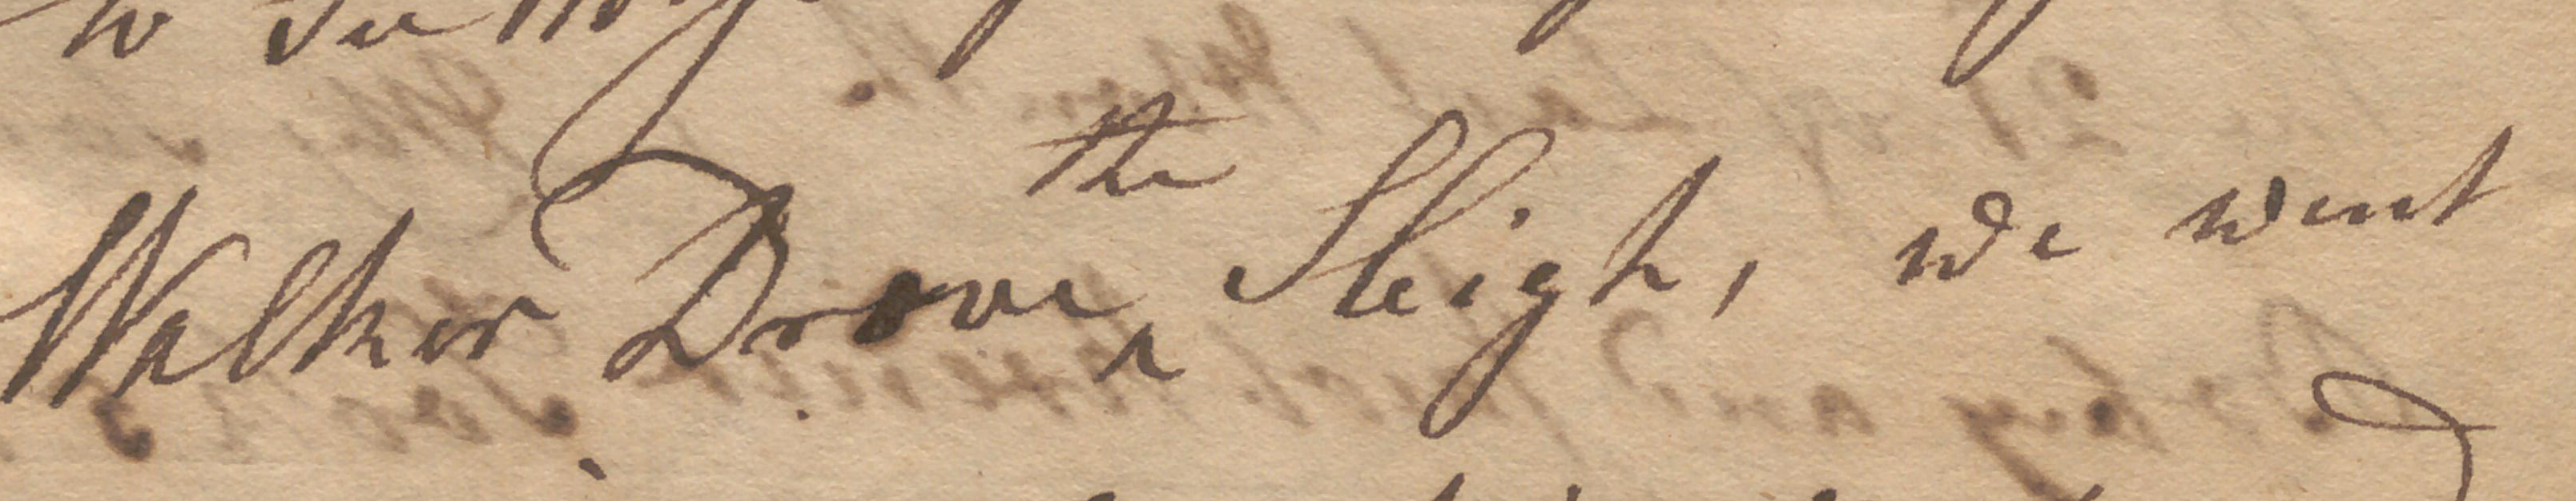Walker Drove ^ Sleighs, we went
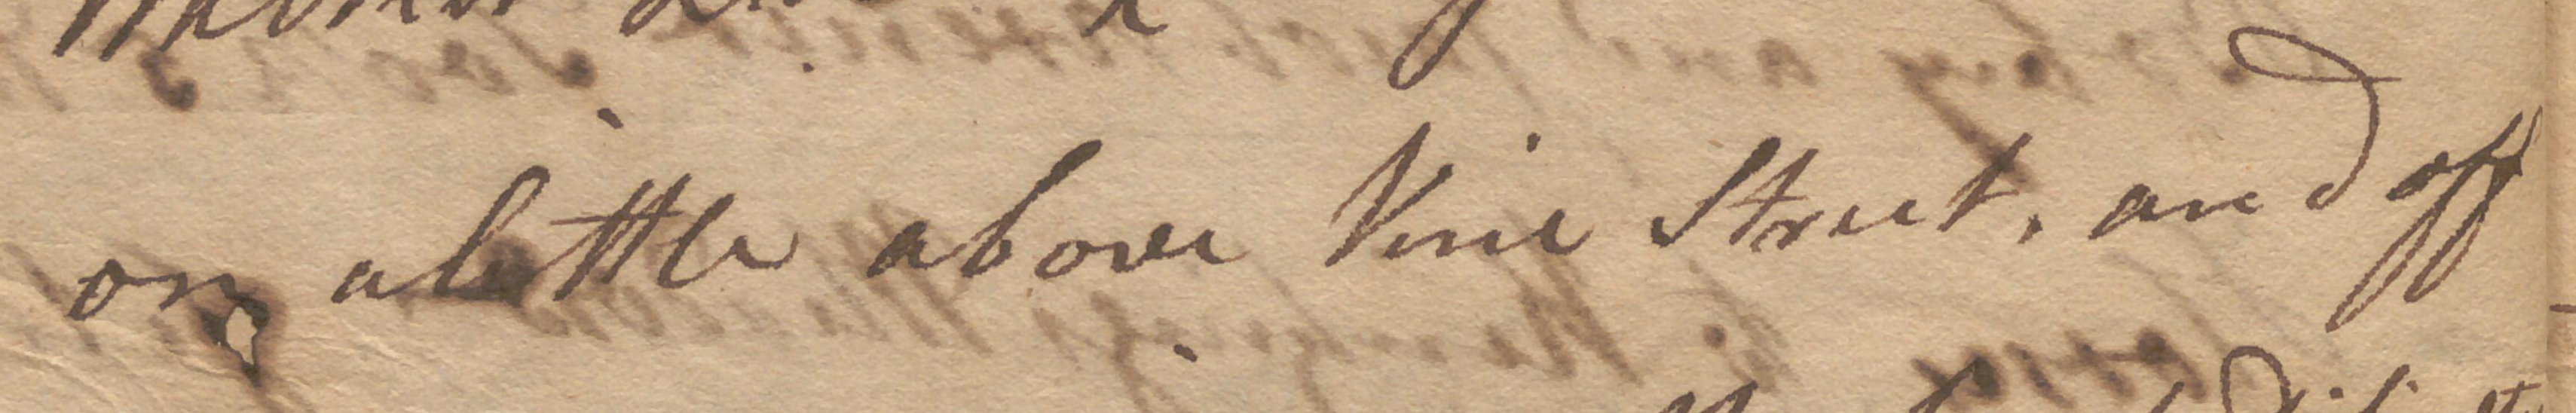on a little above Vine Street, and off
